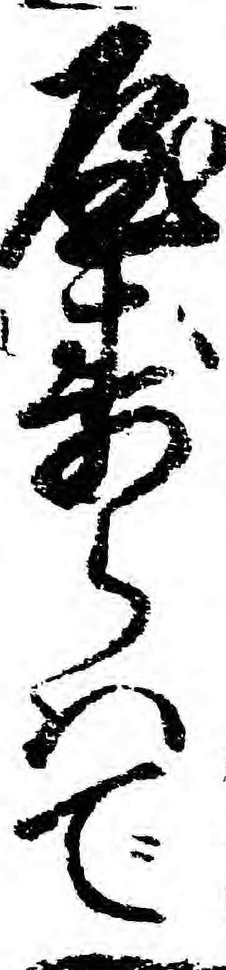やすらはで
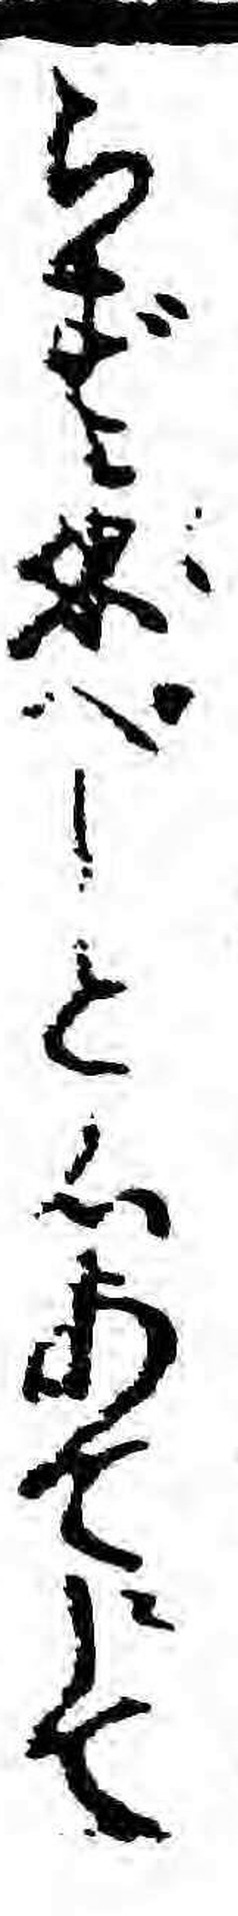らず来べしと心あてにして
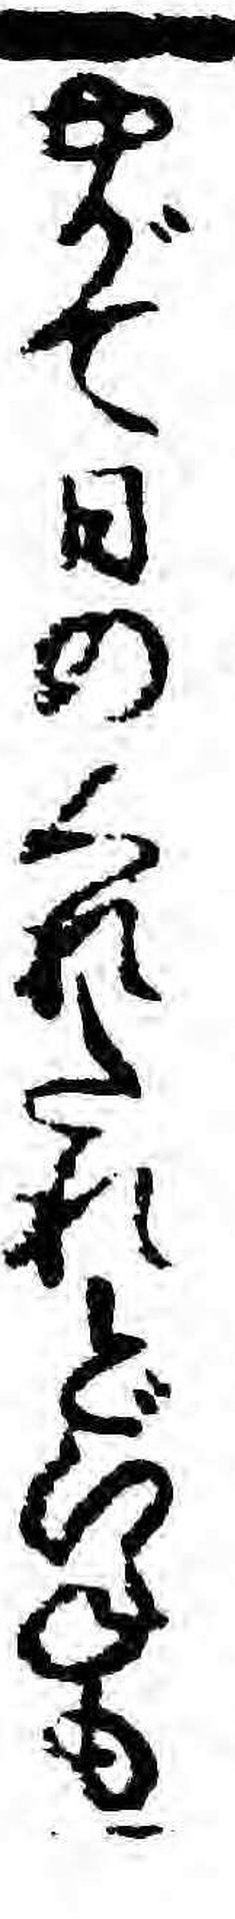やがて日のくれたれどいね
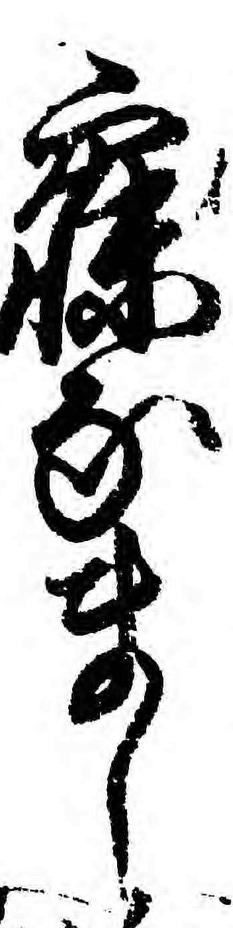寝なまし
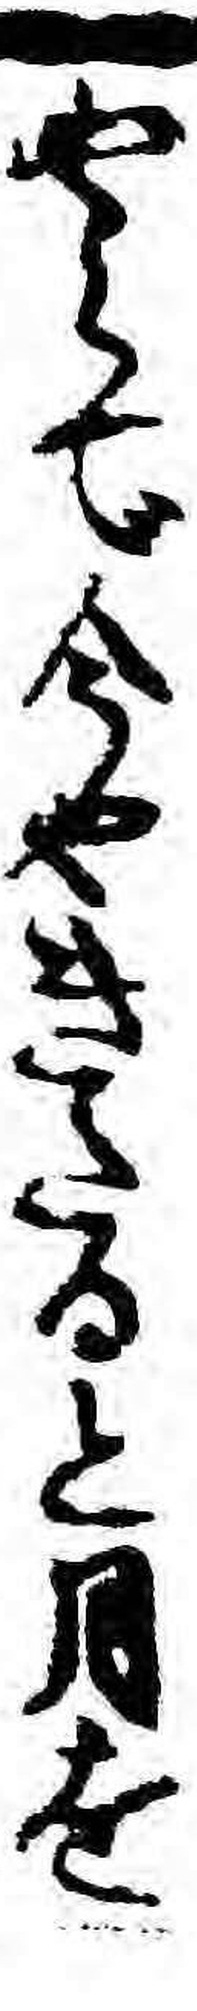もやらで今やきたると月を
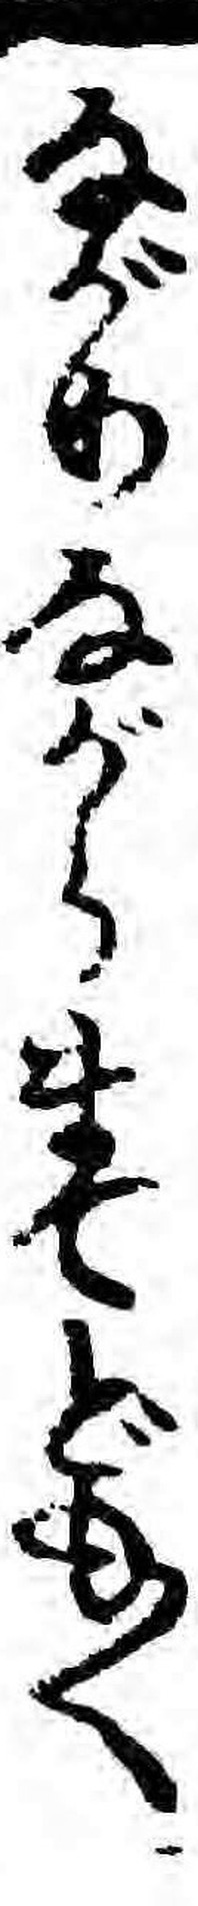ながめながらまてども〳〵
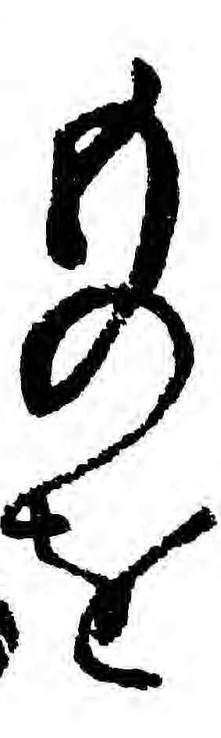ものを
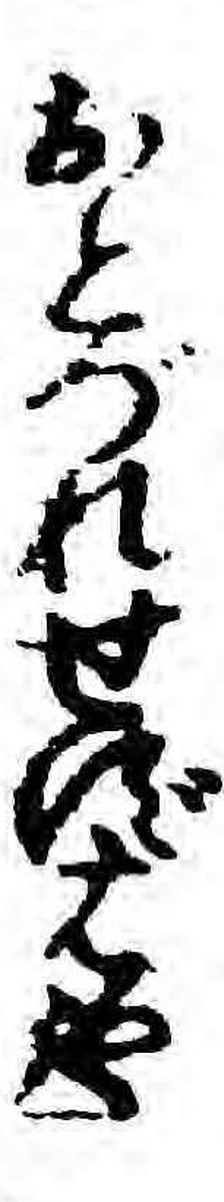おとづれせずはや
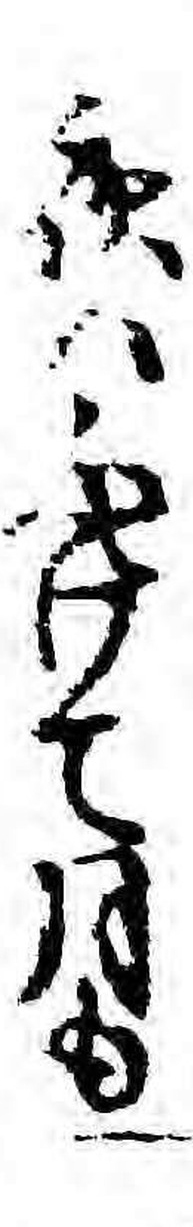夜はふけて月も
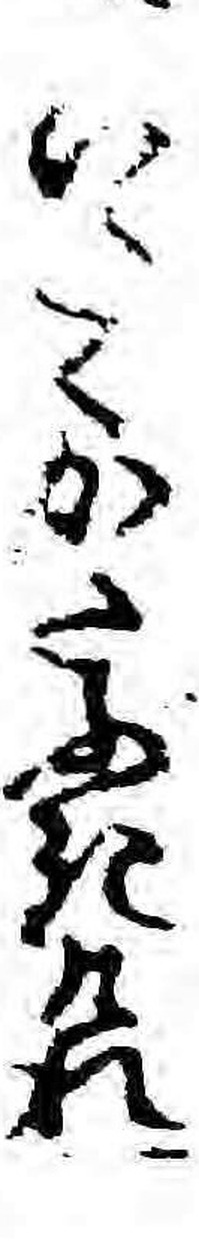いたくかたふきけれ
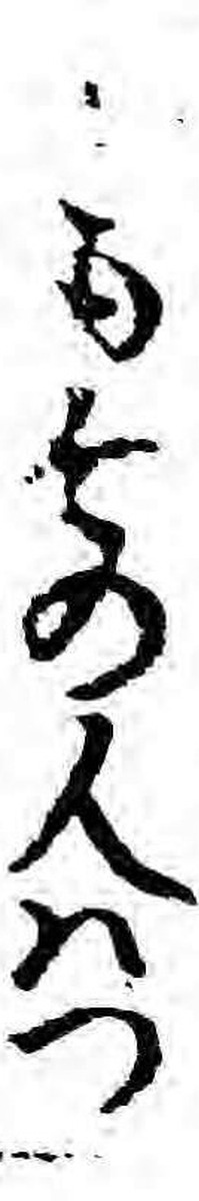どもその人はつ
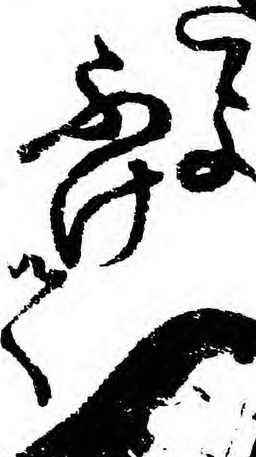ふけて
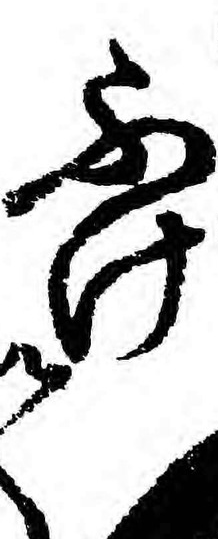ふけて
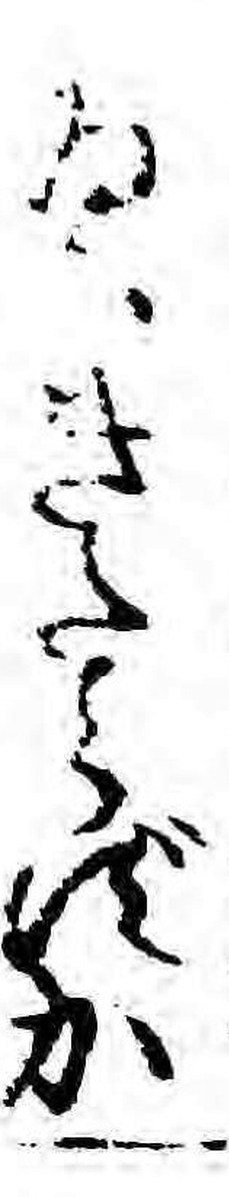ゐにきたらずか
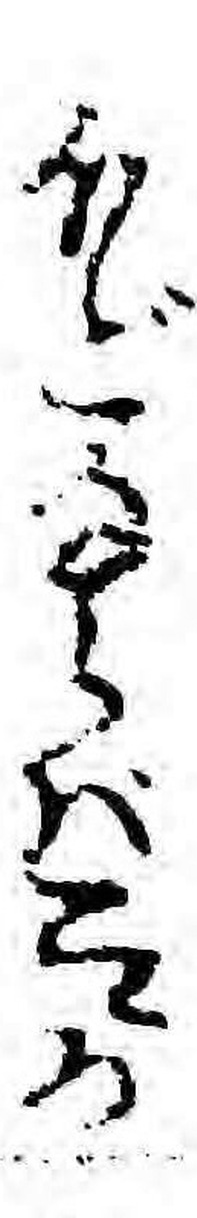ほどならばこゝろ
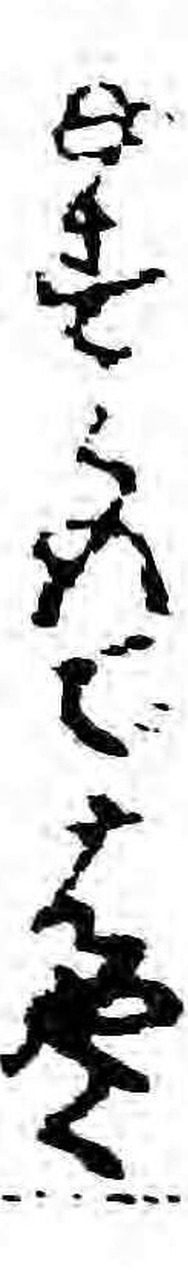やすらはではやく
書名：頭書和歌注譯／壽賀多百人一首小倉錦
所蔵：国文学研究資料館
